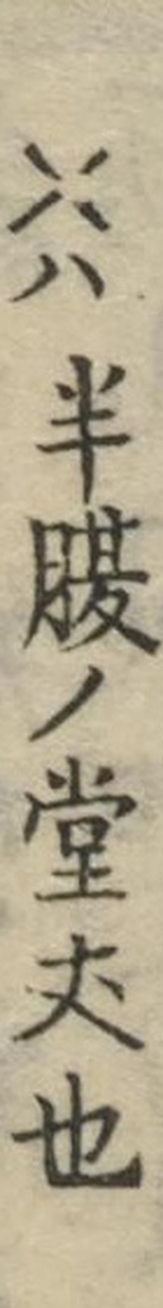×ハ半腹ノ堂丈也
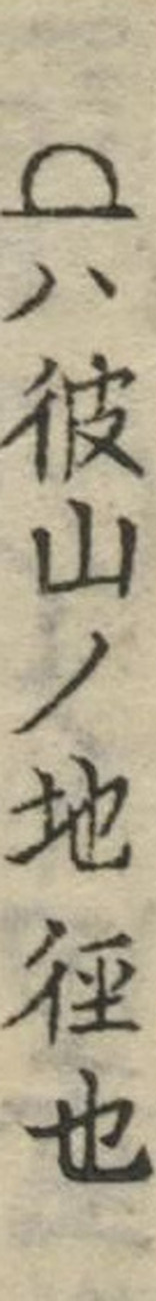◯ハ彼山ノ地径也
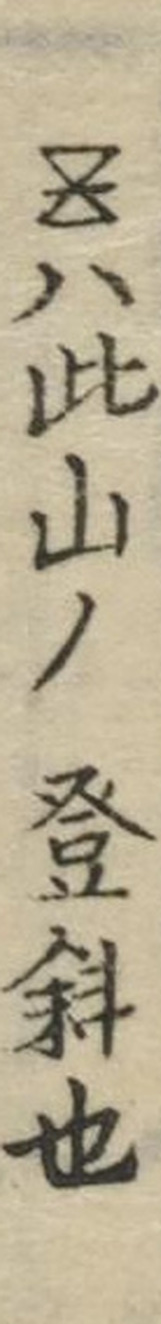▽△ハ此山ノ登斜也
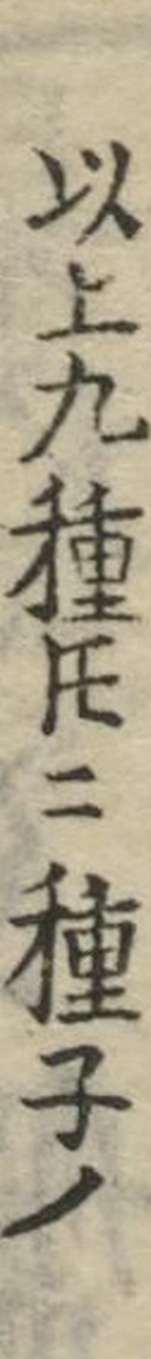以上九種トモニ種子ノ
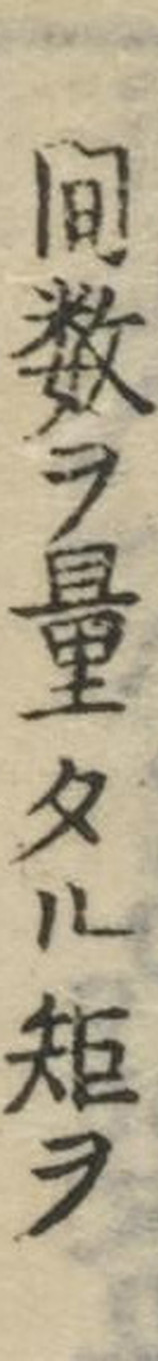間数ヲ量タル矩ヲ
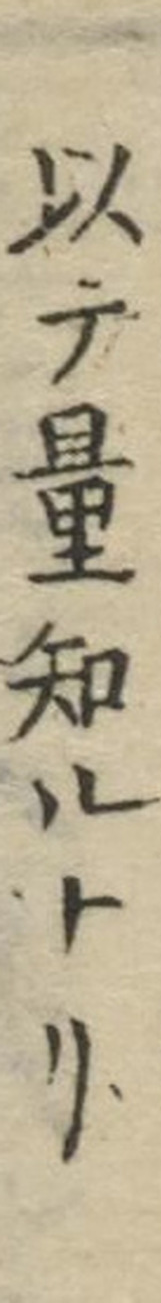以テ量知ルナリ

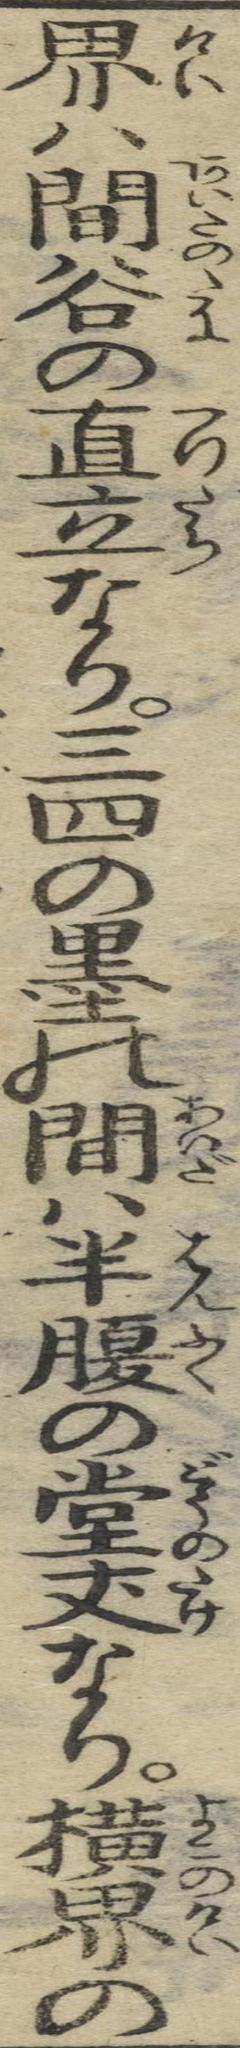界は間谷の直立なり。三四の墨の間は半腹の堂丈なり。横界の
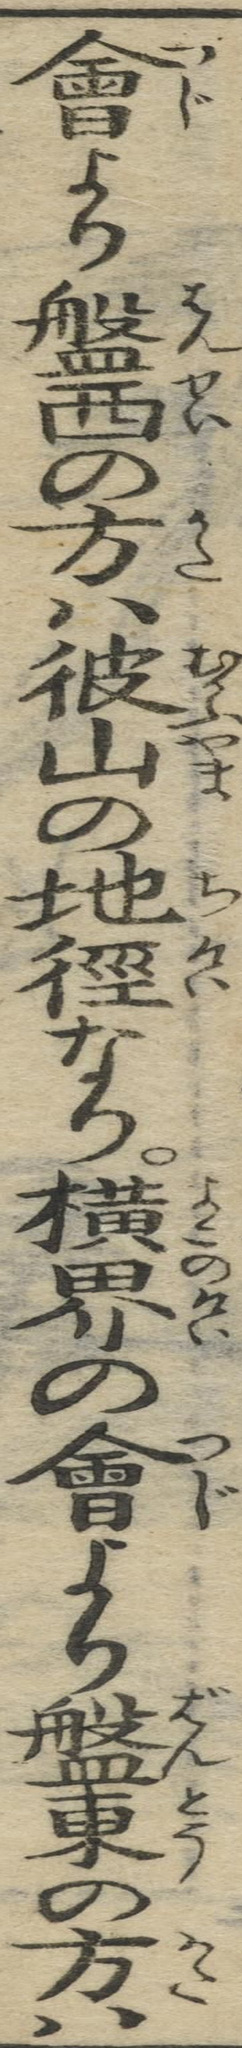会より盤西の方は彼山の地径なり。横界の会より盤東の方は
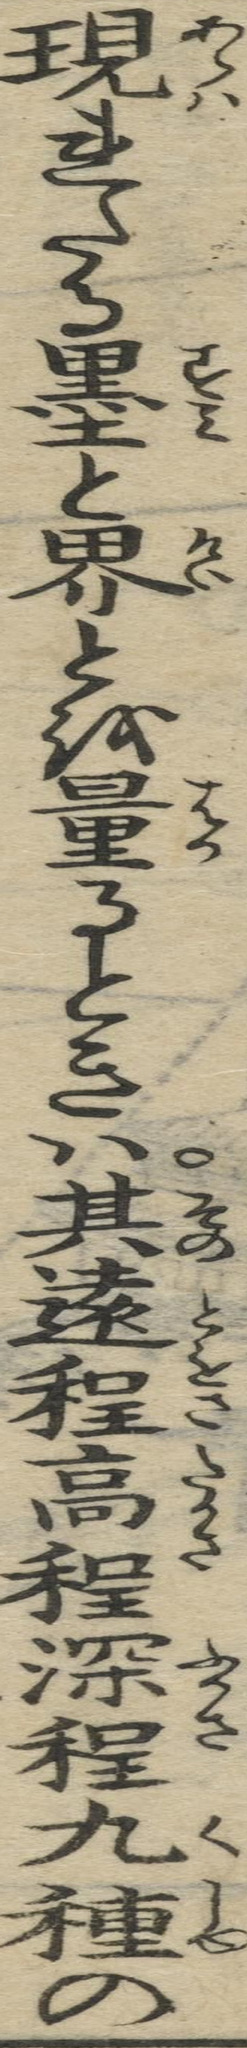現れたる墨と界とを量るときは。其遠程高程深程九種の
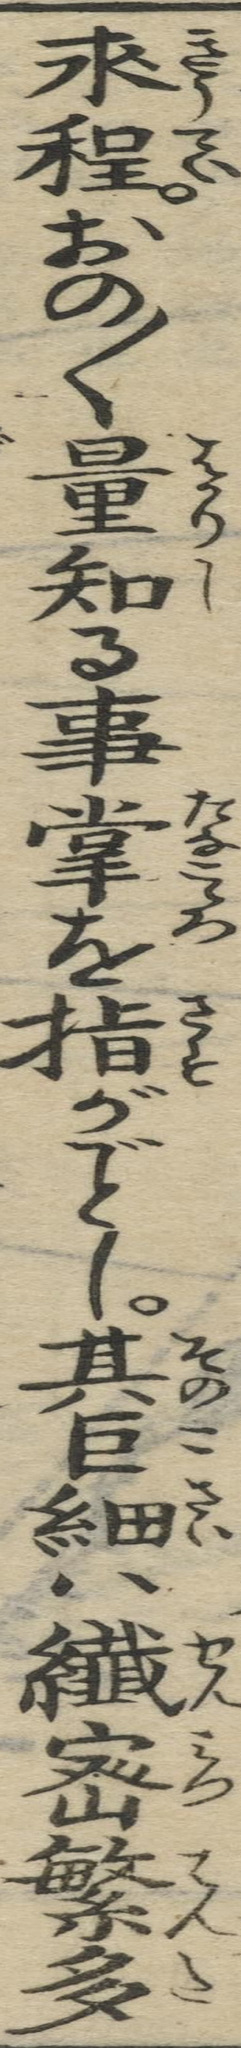求程。おの〳〵量知る事掌を指がごとし。其巨細は繊密繁多
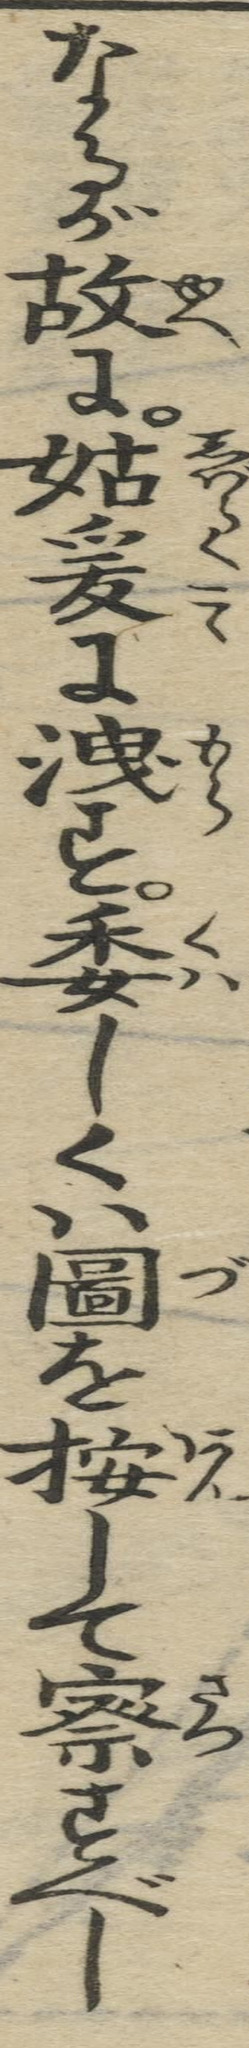なるが故に。姑爰に洩す。委しくは図を按して察すべし
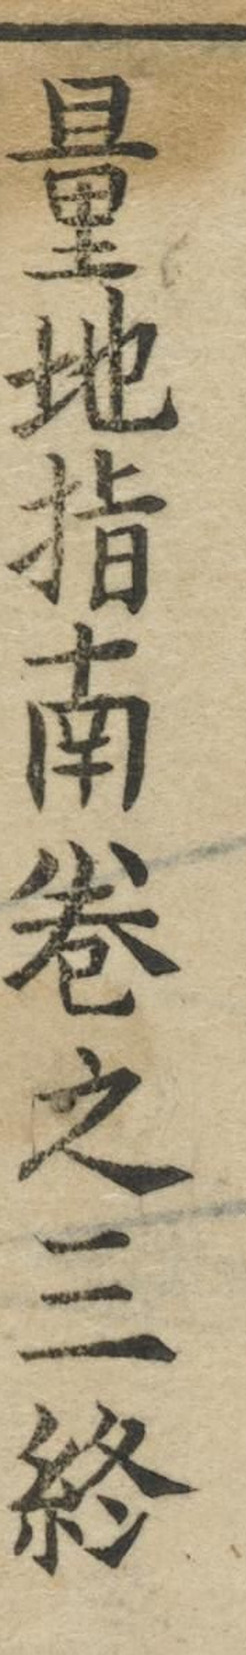量地指南巻之三終
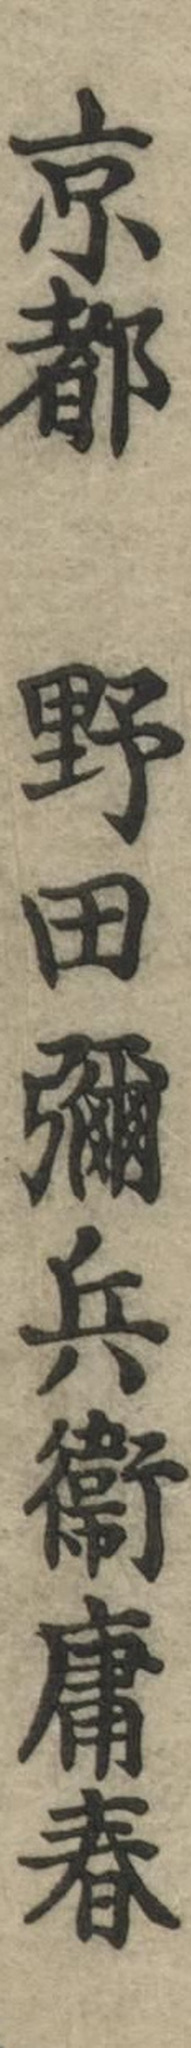京都野田彌兵衛庸春
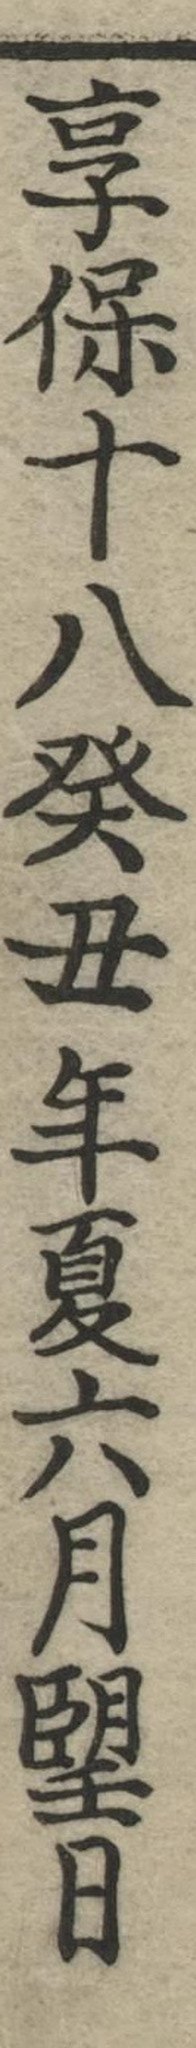享保十八癸丑年夏六月朢日仝刻
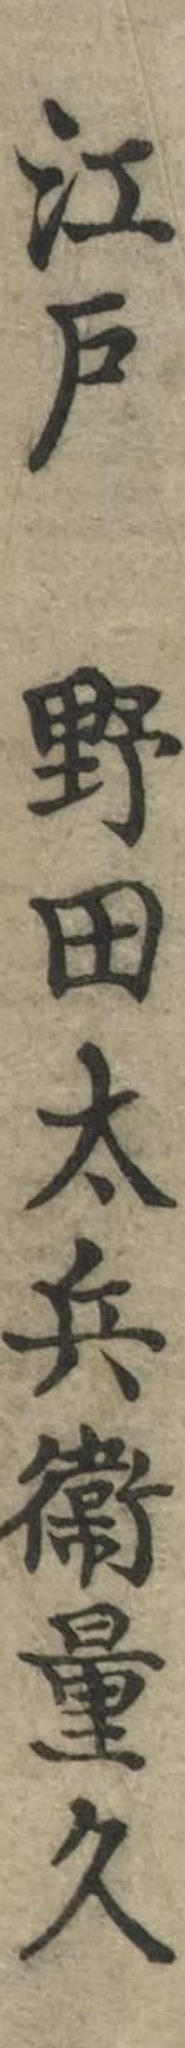江戸野田太兵衛量久
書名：量地指南　巻之三（内題）
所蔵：東京大学地震研究所図書室 Earthquake Research Institute Library, The University of Tokyo, JAPAN
